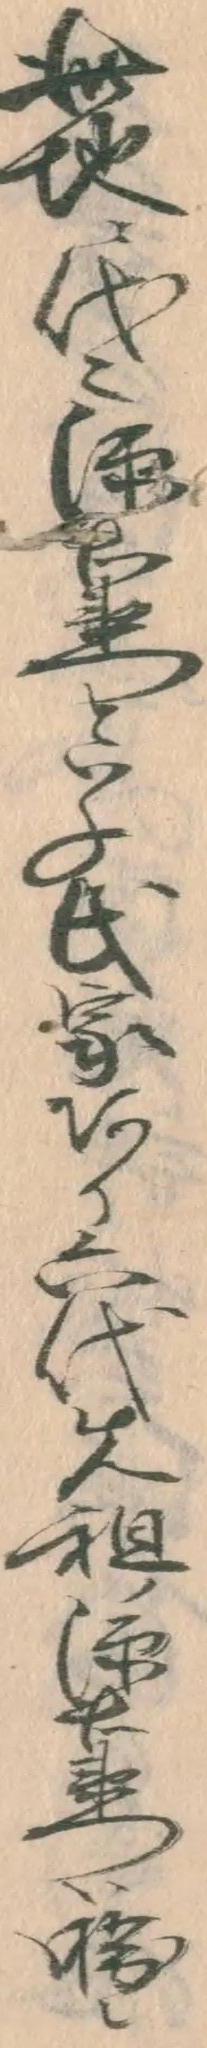此地に代々源右衛門といふ民家あり六代先祖の源左衛門は勝れ
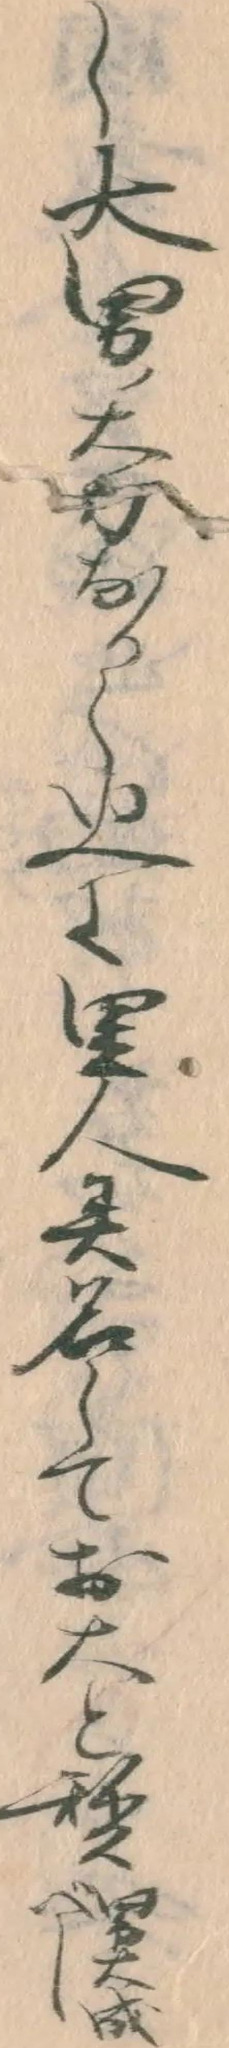し大男の大力なりしゆへに里人異名してお大と称す男大成べし
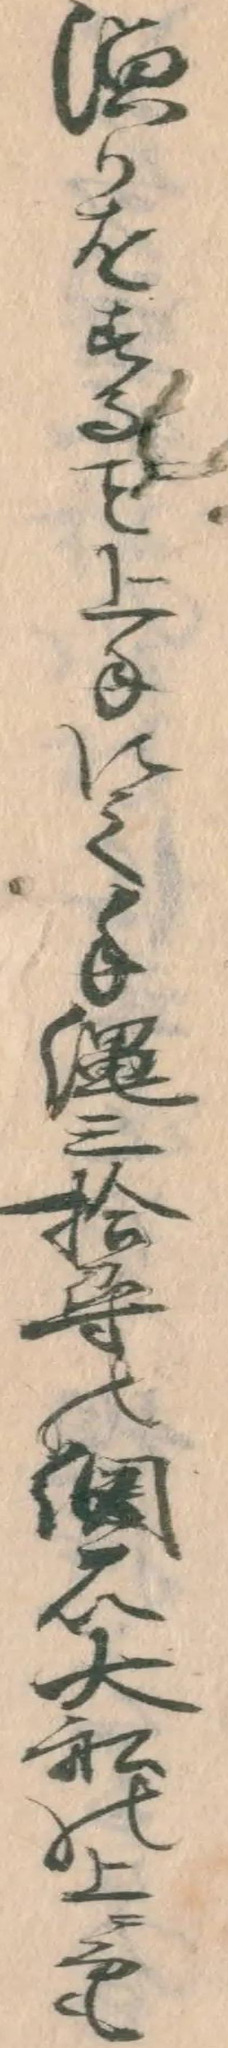漁りをすること上手にて手縄三拾尋の網を以大船の上にても
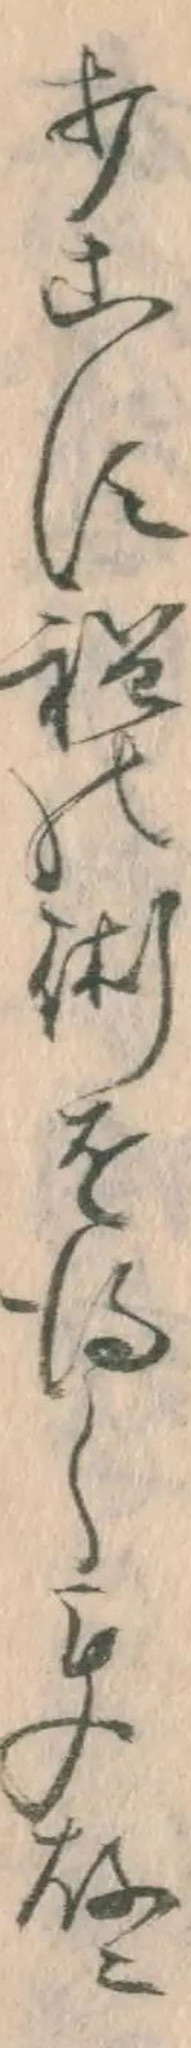打こす程の術を得しもの故に
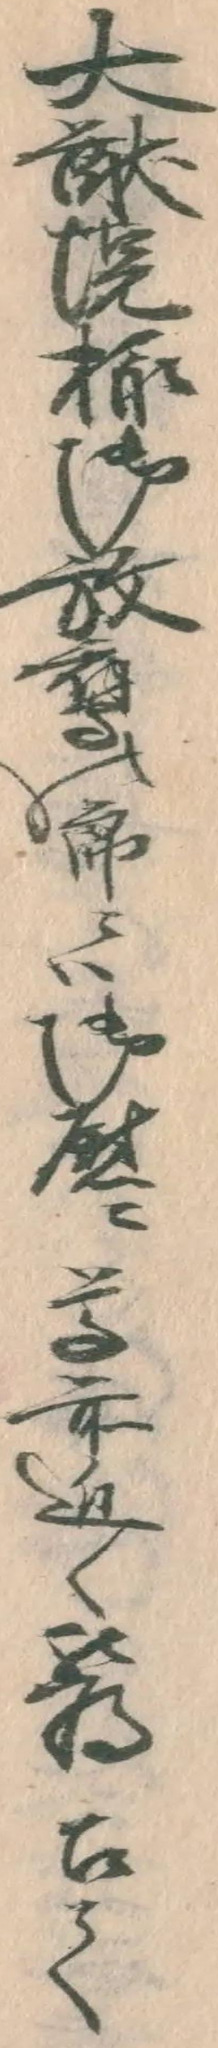大猷院様御放鷹の席には御慰に尊前近く被為召て
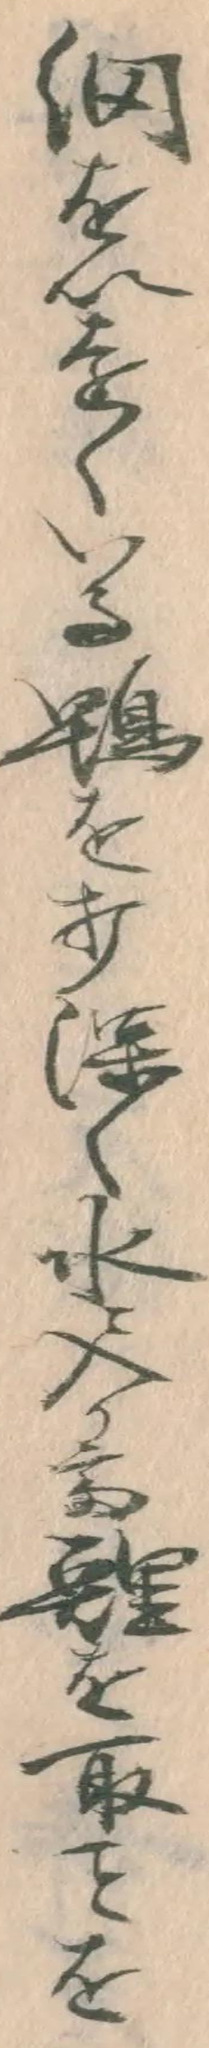網を以遠くいる鴨を打深く水に入りて鯉を取ことを
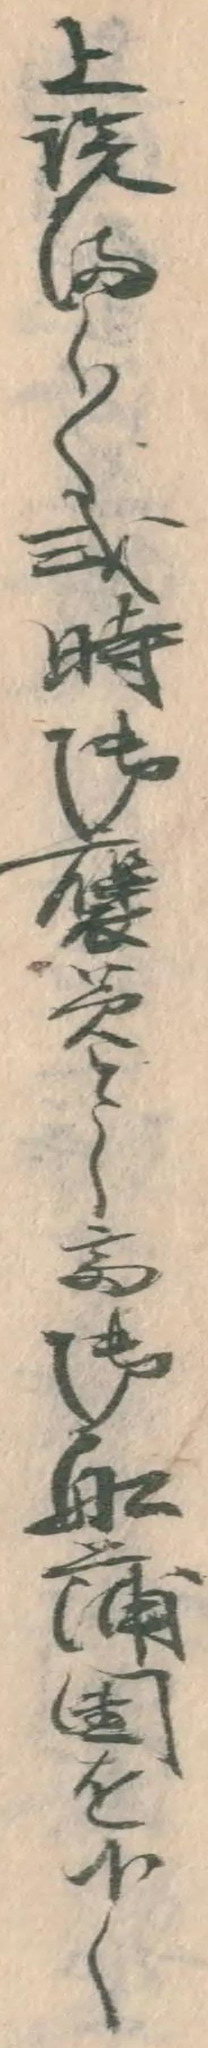上覧まし〳〵或時御褒美として御船蒲団を下し
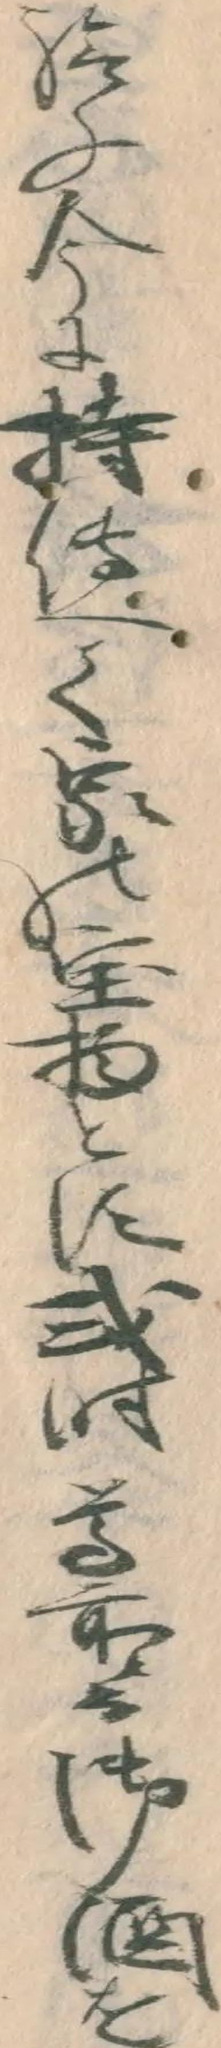給ふ今に持伝へて家の宝物とす或時尊所にて御酒を
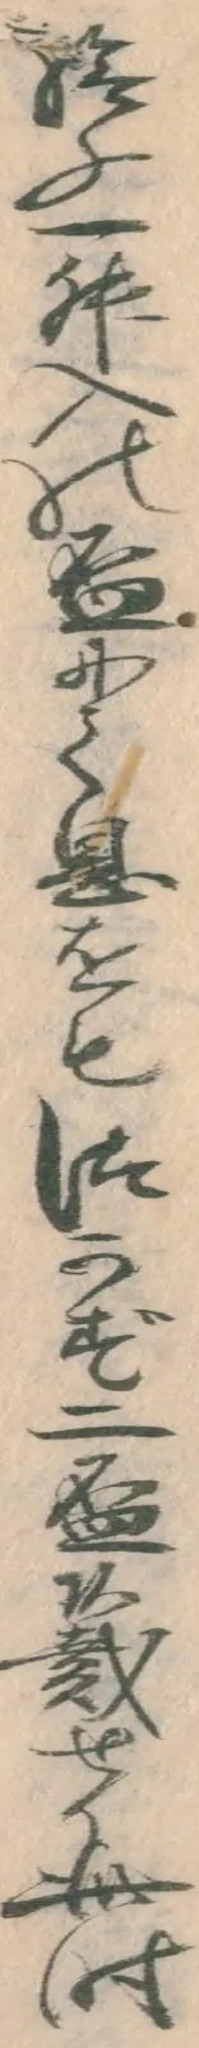給ふ一升入の盃にて息をもつかず二盃頭戴せり此時

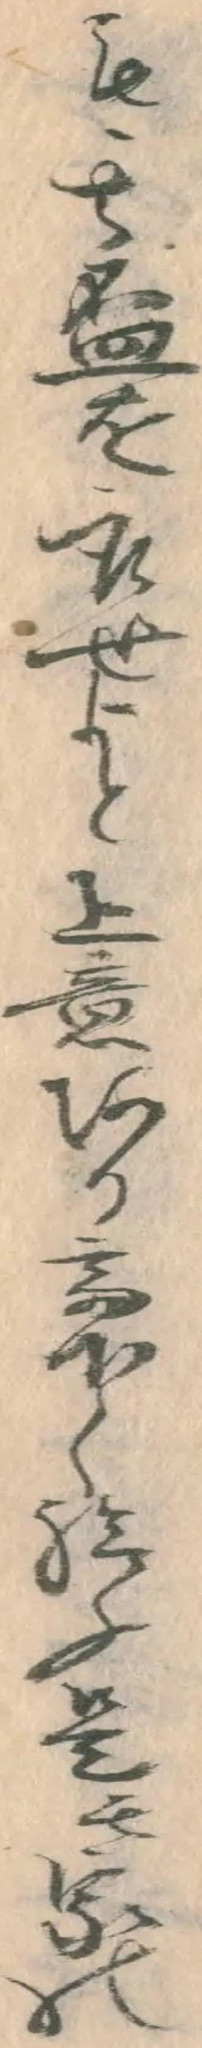も其盃を取せよと上意ありて下し給ふ是も家の
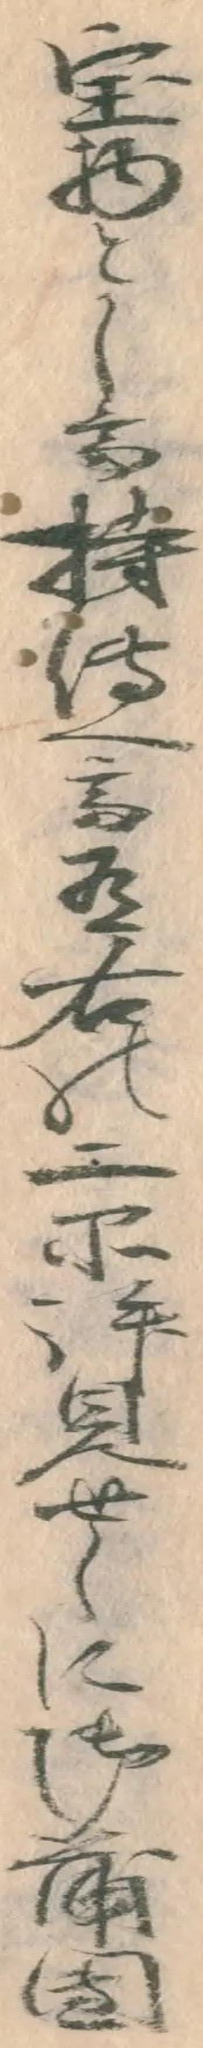宝物として持伝へて有右の二品拝見せしに御蒲団
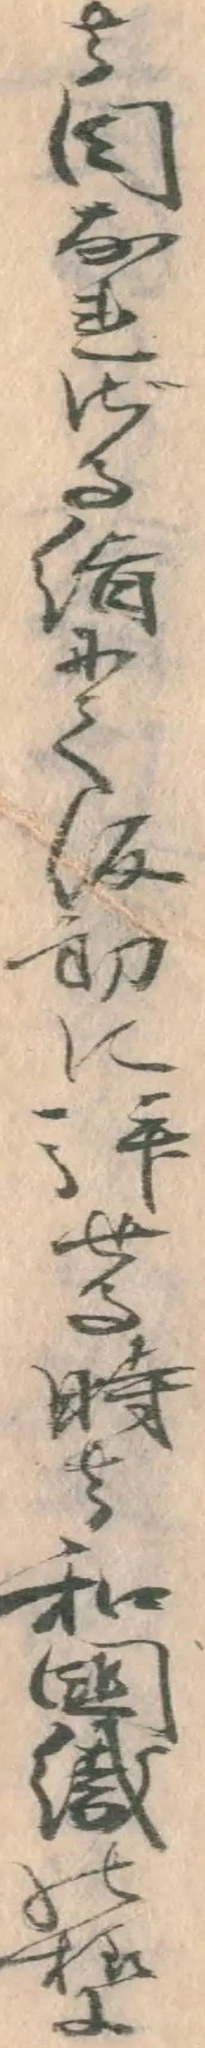は目なれざる絹にて仮初に拝せる時は和国織の様に
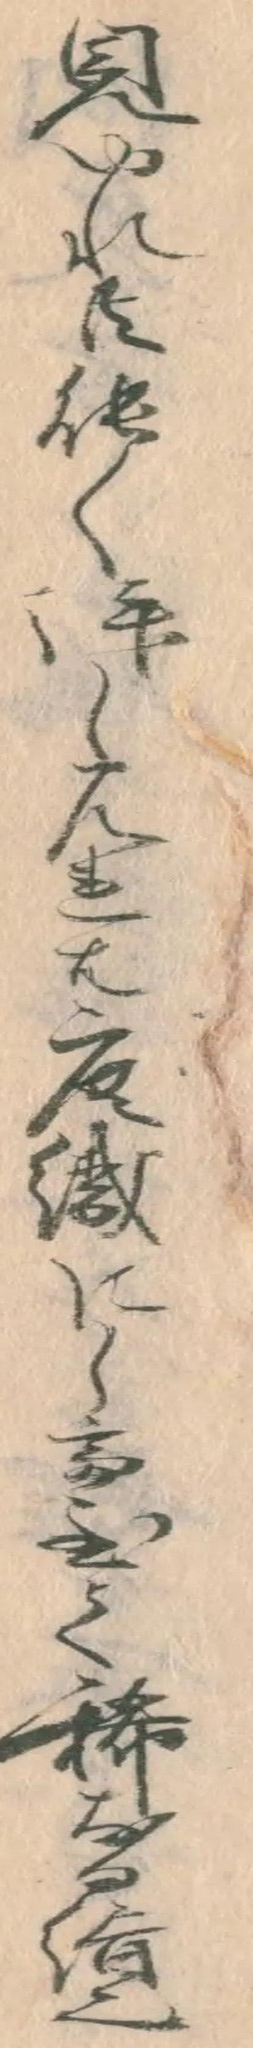見ゆれ共能く拝し見れは唐織にして至て稀なる絹也
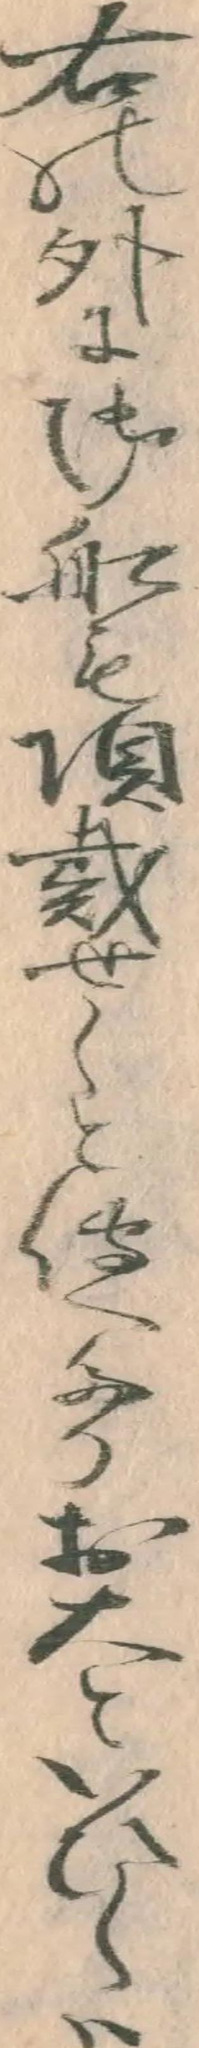右の外に御船も頂戴せしと伝へたりお大といひしは
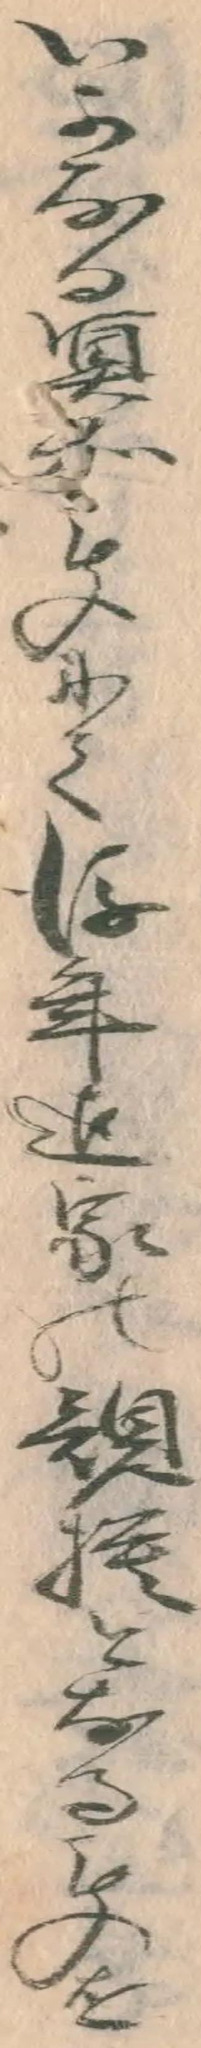いかなる冥加ものにて後年迄家の親模となるものを
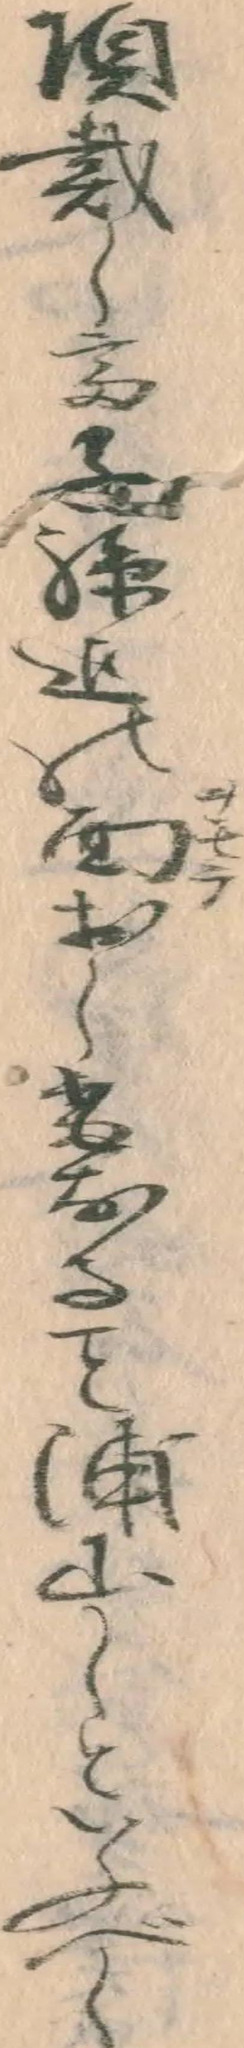頂戴して子孫迄の面おしとなること浦山しといふべし
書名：四神地名録 6巻. [4]葛飾郡
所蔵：国立国会図書館 National Diet Library, JAPAN
